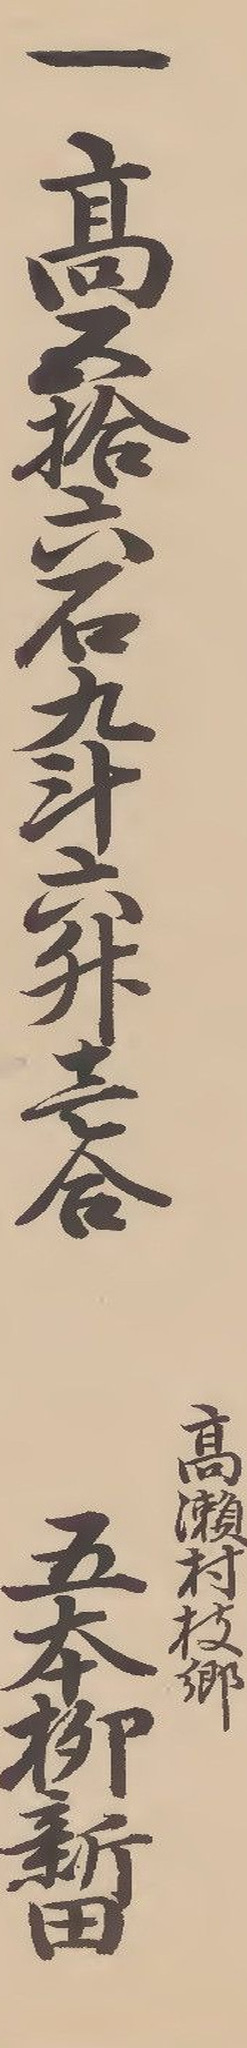一高五拾六石九斗六升壱合五本柳新田
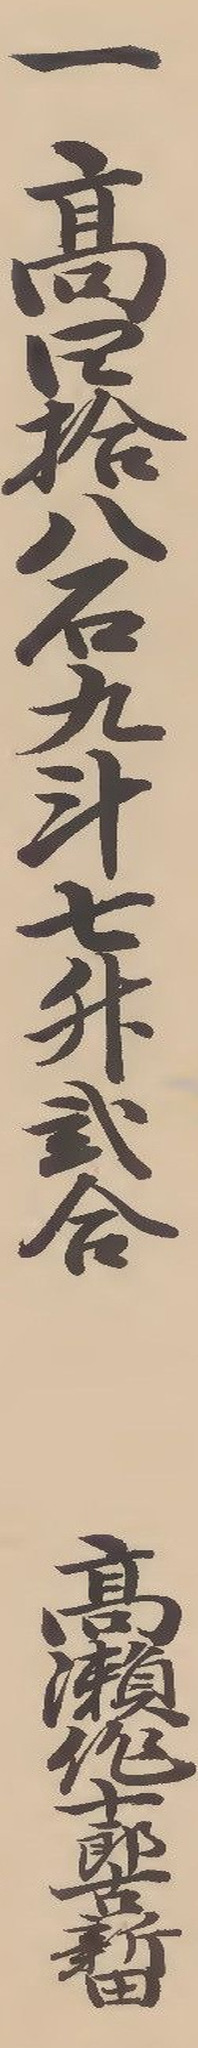一高四拾八石九斗七升弐合高瀬作十郎古新田
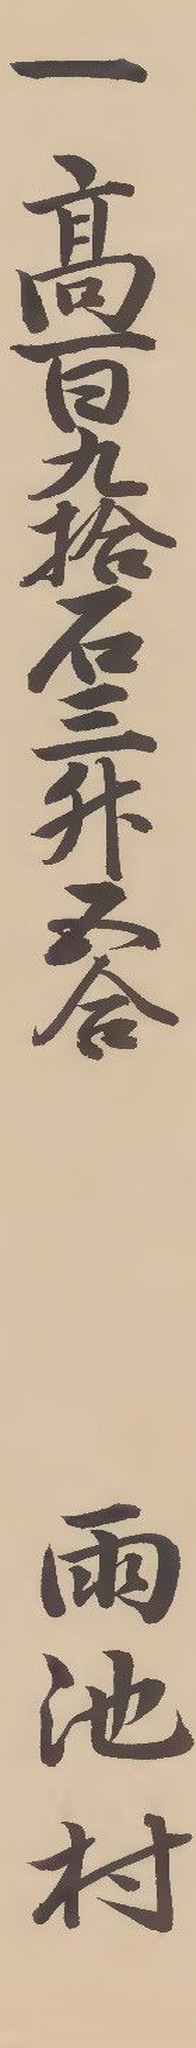一高百九拾石三升五合雨池村
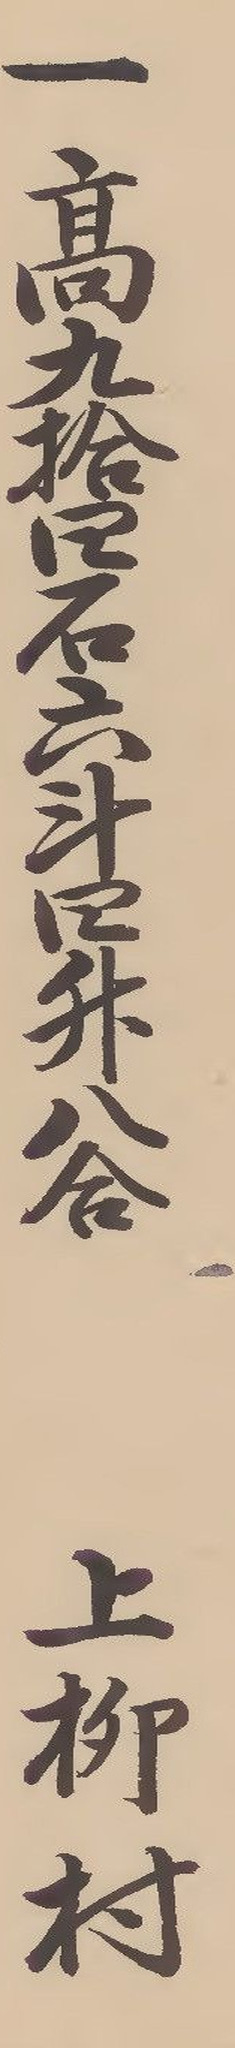一高九拾四石六斗四升八合上柳村

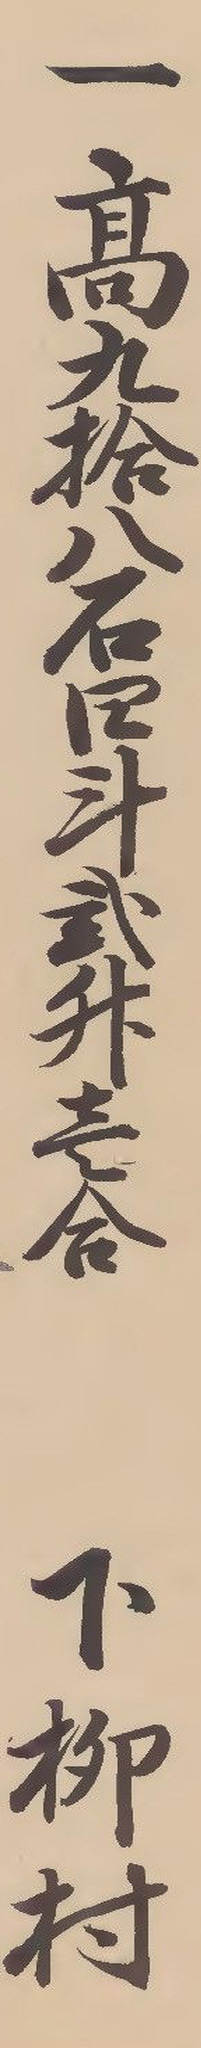一高九拾八石四斗弐升壱合下柳村
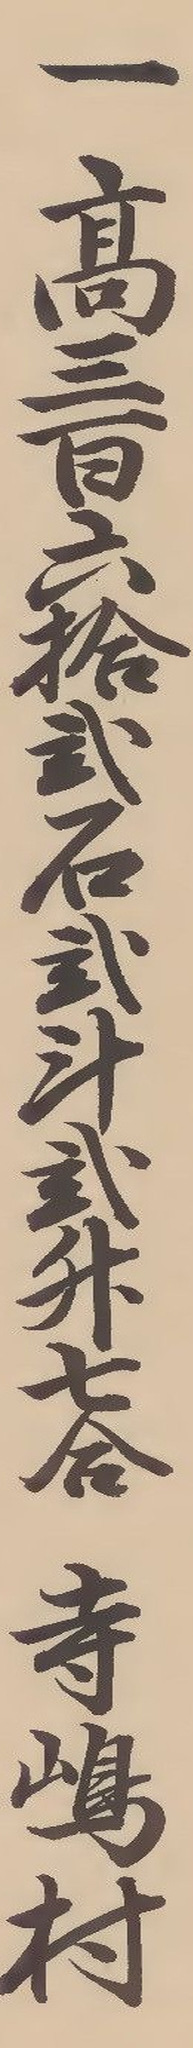一三百六拾弐石弐斗弐升七合寺島村
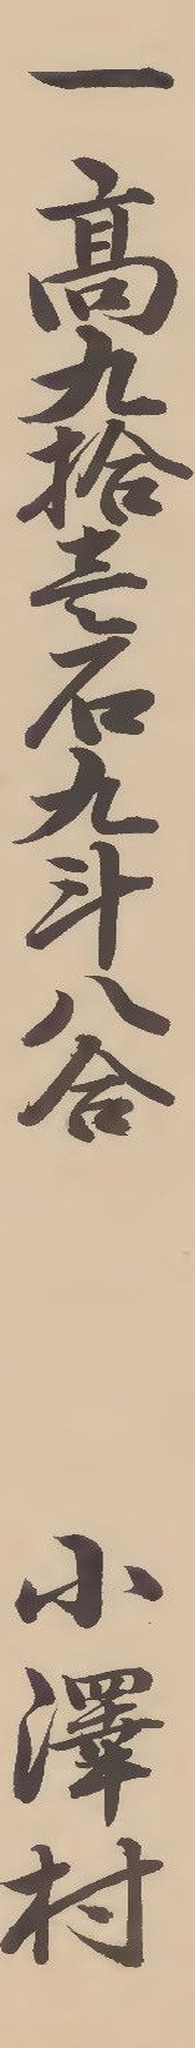一高九拾壱石九斗八合小沢村
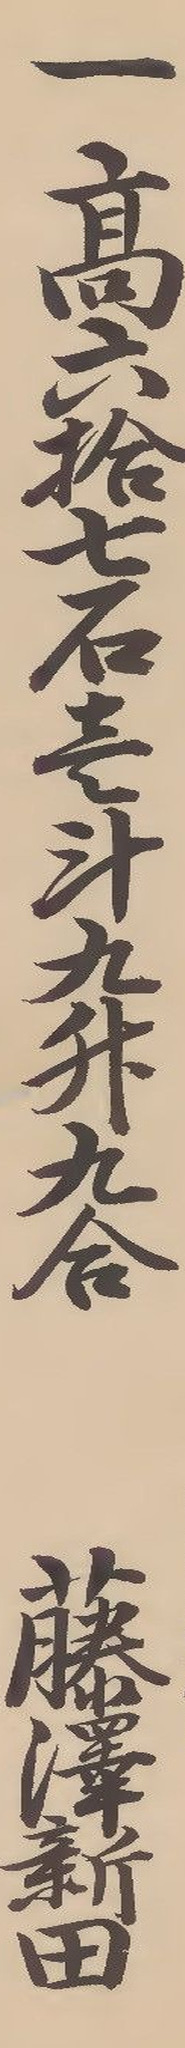一高六拾七石壱斗九升九合藤沢新田
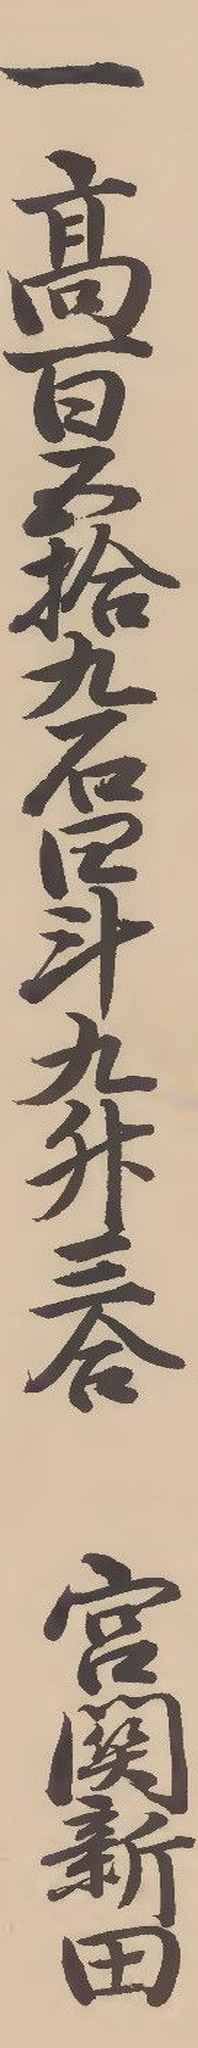一高百五拾九石四斗九升三合宮関新田
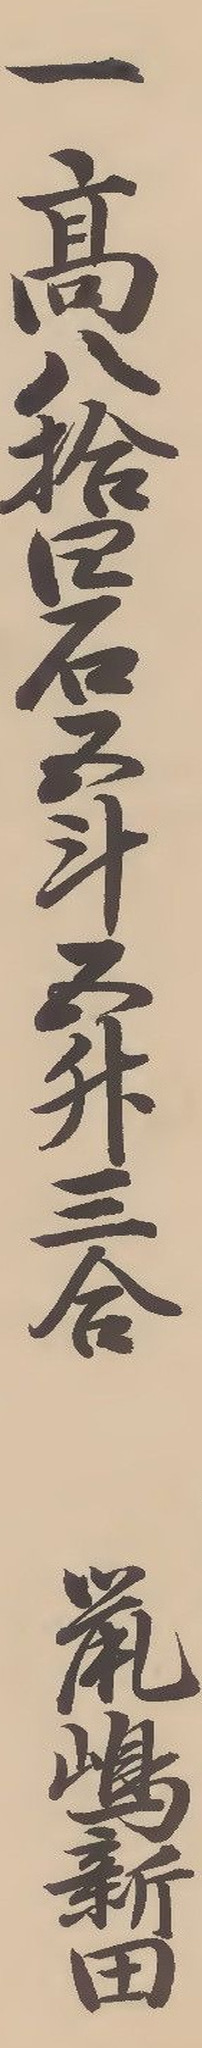一高八拾四石五斗五升三合鼠島新田
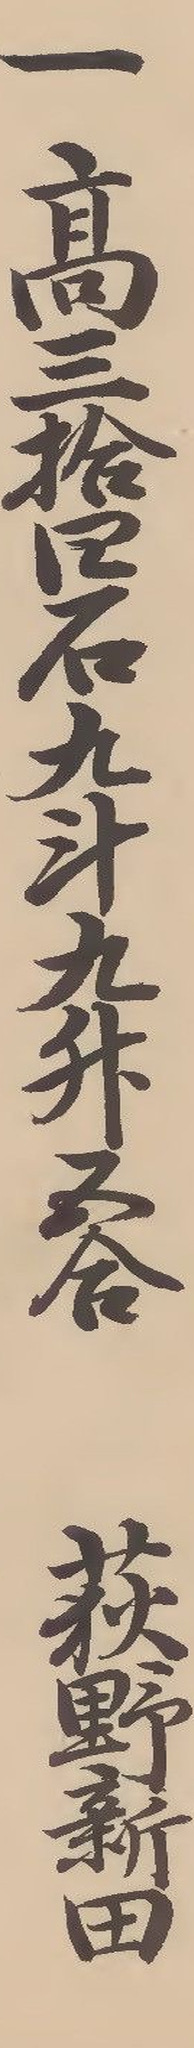一高三拾四石九斗九升五合荻野新田
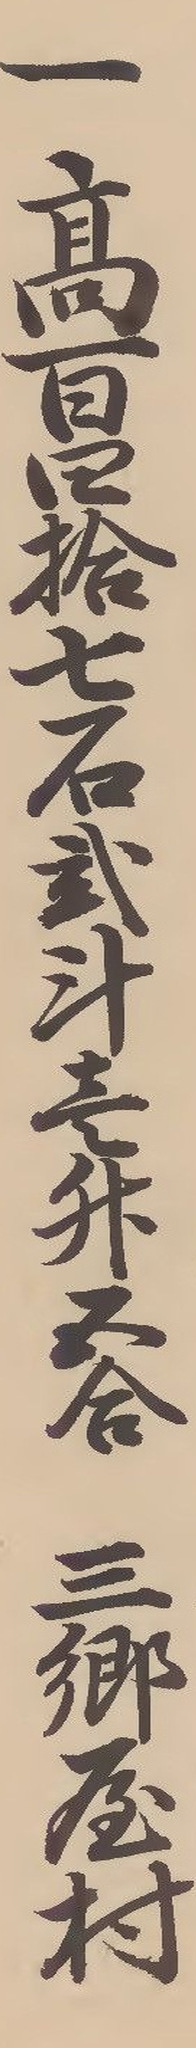一高百四拾七石弐斗壱升五合三郷屋村

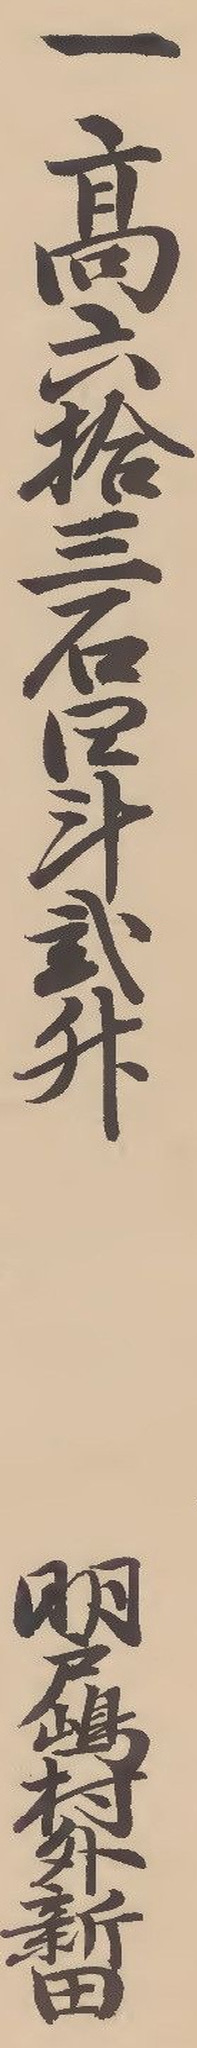一高六拾三石四斗弐升明戸島村外新田
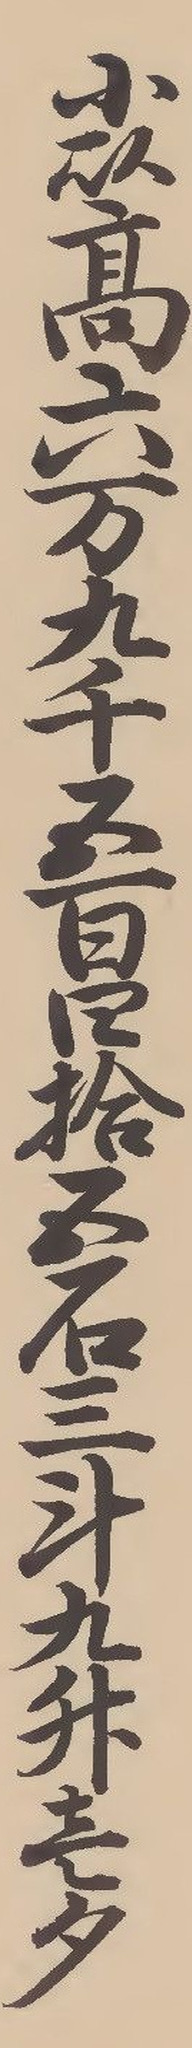小以高六万九千五百四拾五石三斗九升壱勺
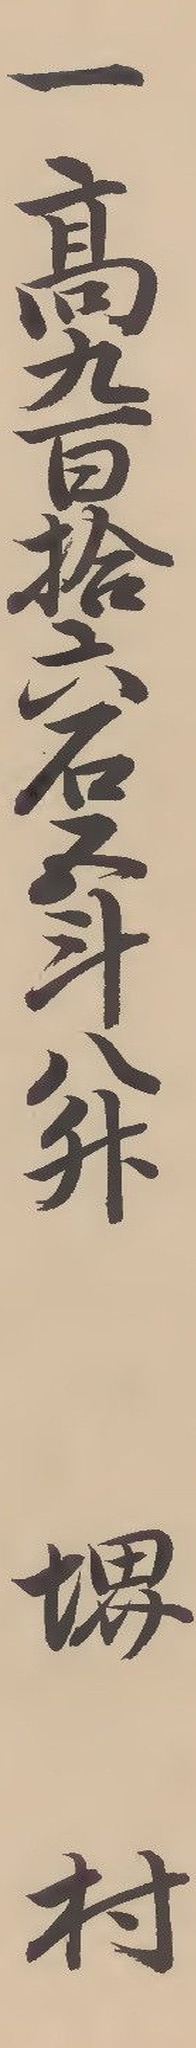一高九百拾六石五斗八升堺村
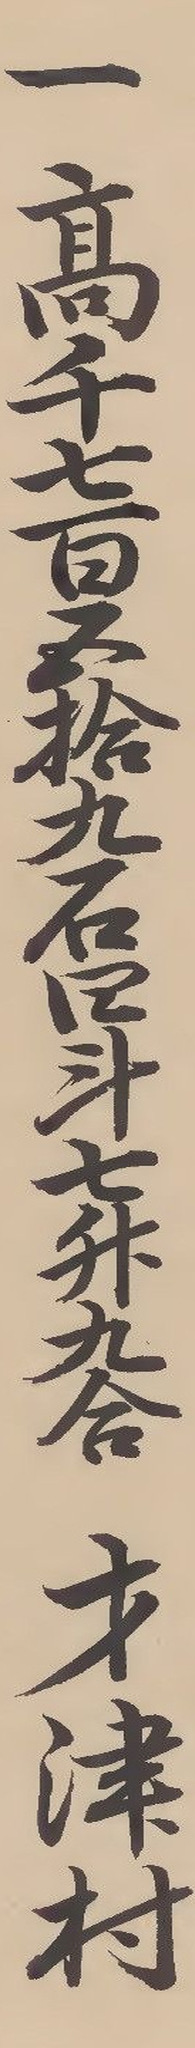一高千七百五拾九石四斗七升九合才津村
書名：越後国郷帳　中
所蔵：国立公文書館 National Archives of Japan
